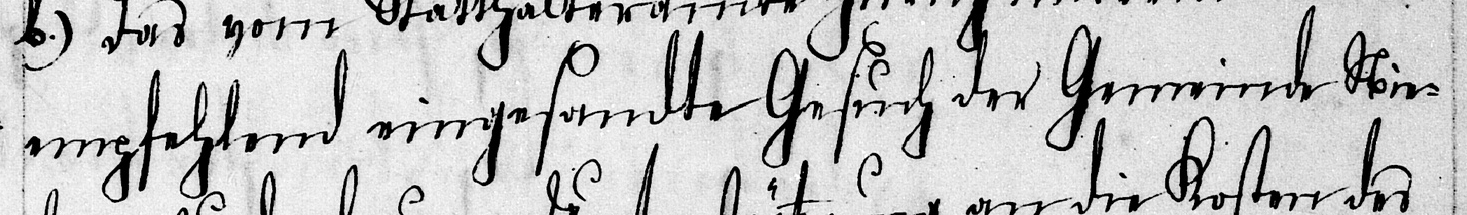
empfehlend eingesandte Gesuch der Gemeinde Nie¬
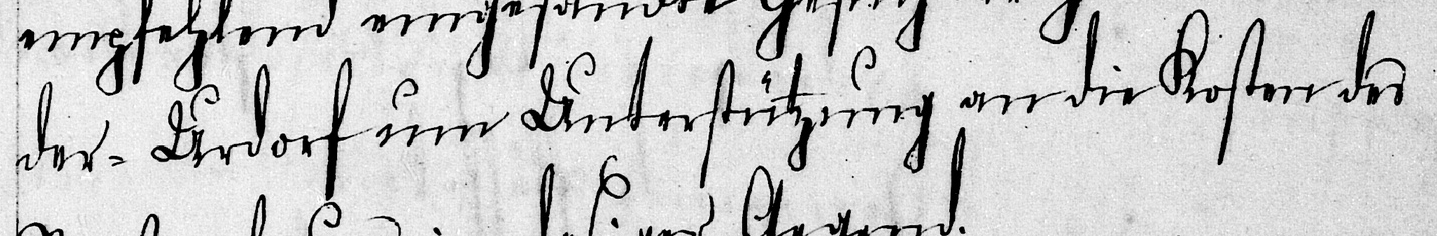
der-Urdorf um Unterstützung an die Kosten des
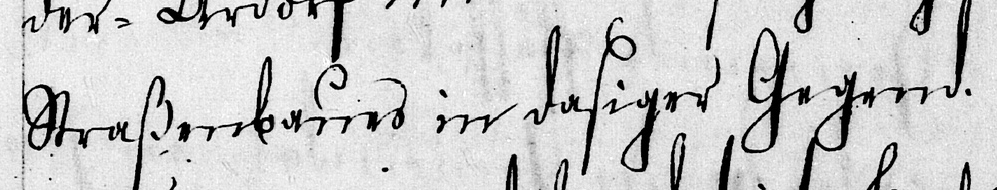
Straßenbaues in dasiger Gegend.
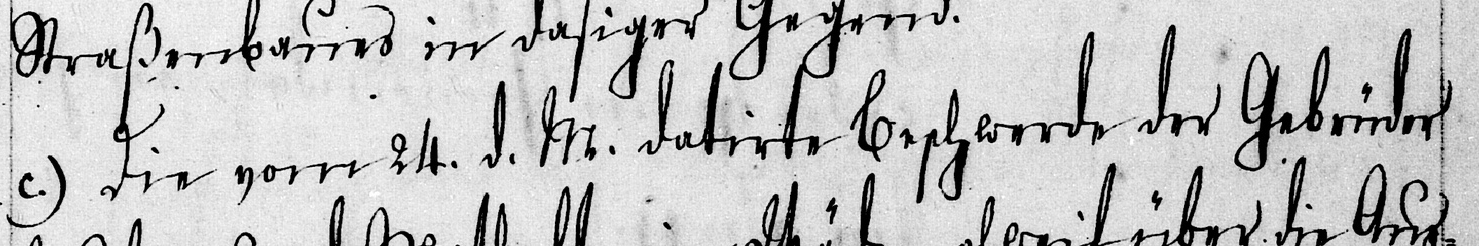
c.) Die vom 24. d. M. datirte Beschwerde der Gebrüder
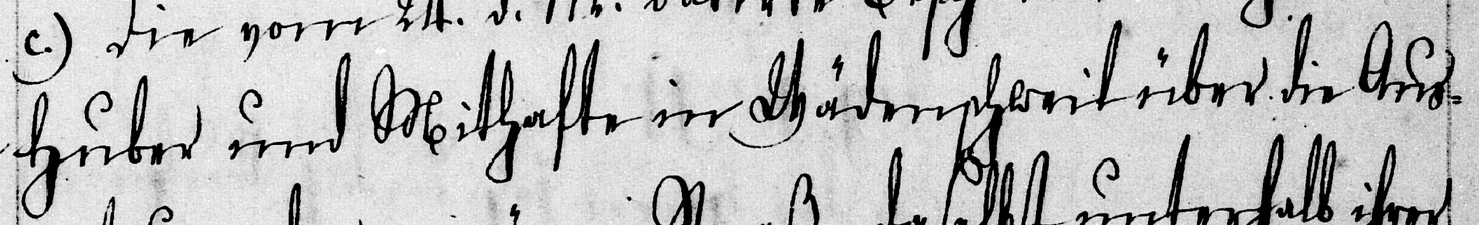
Huber und Mithafte in Wädenschweil über die Aus¬
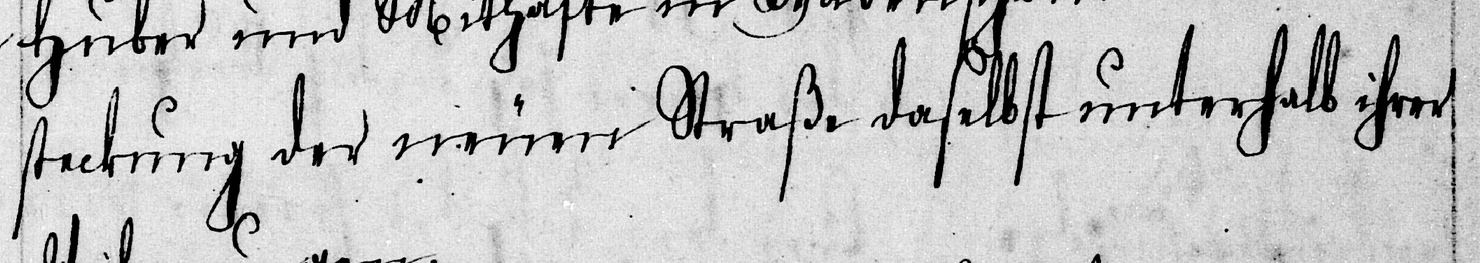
steckung der neuen Straße daselbst unterhalb ihrer
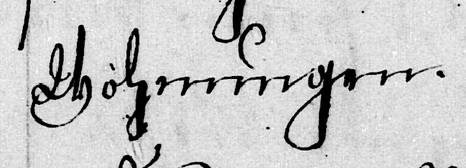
Wohnungen.
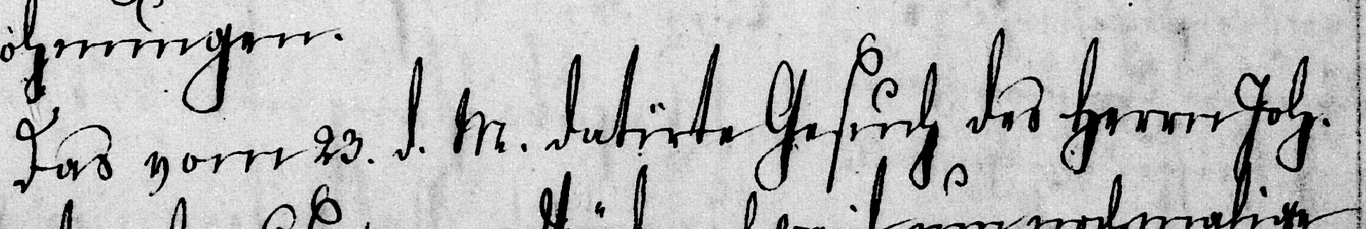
Das vom 23. d. M. datirte Gesuch des Herrn Joh.
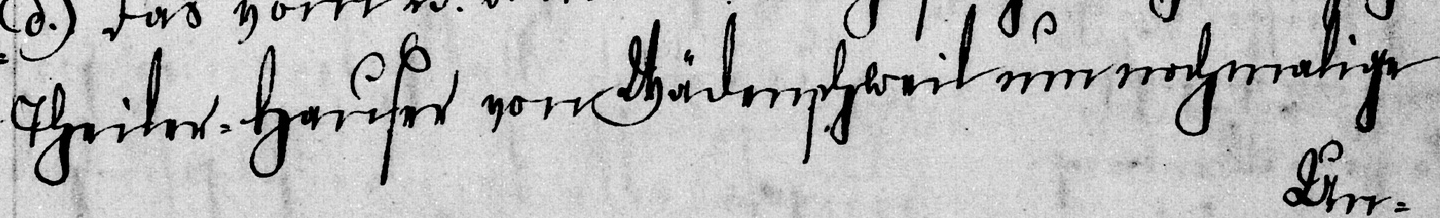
Theiler-Hauser von Wädenschweil um nochmalige
